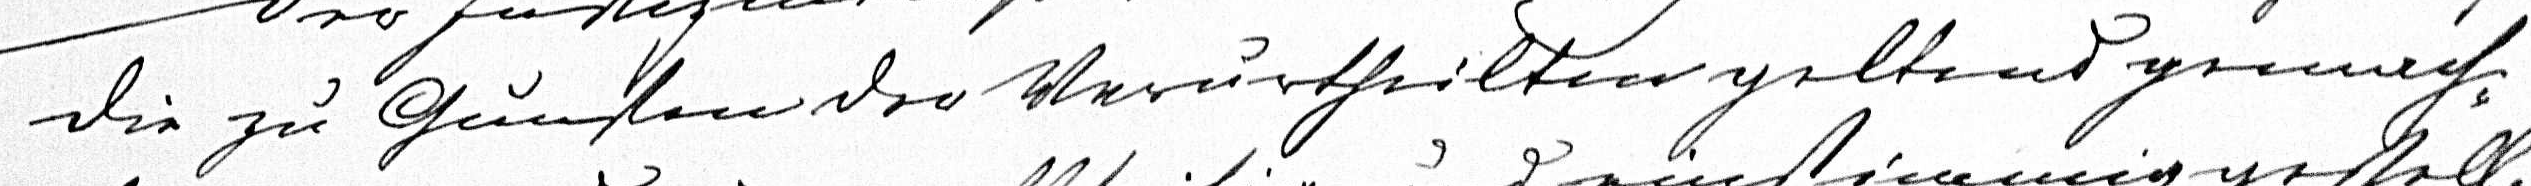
die zu Gunsten der Verurtheilten geltend gemach¬
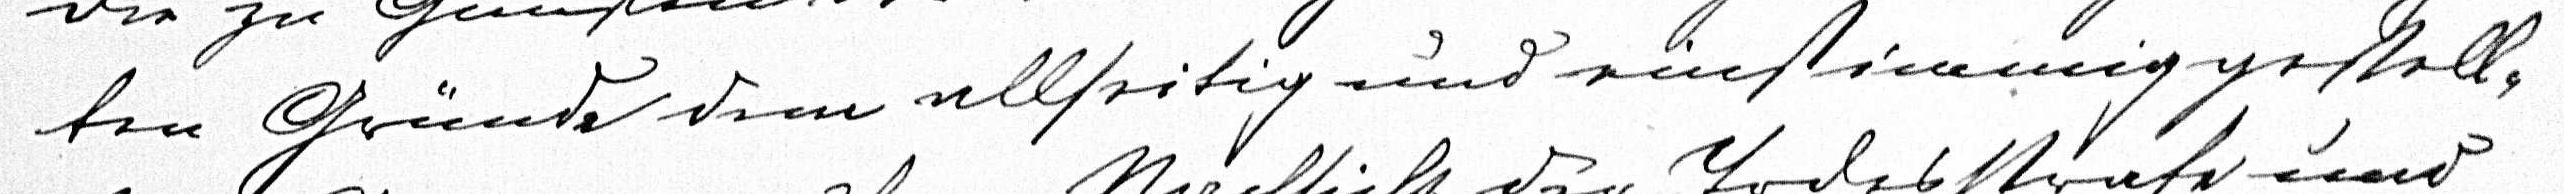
ten Gründe dem allseitig und einstimmig gestell¬
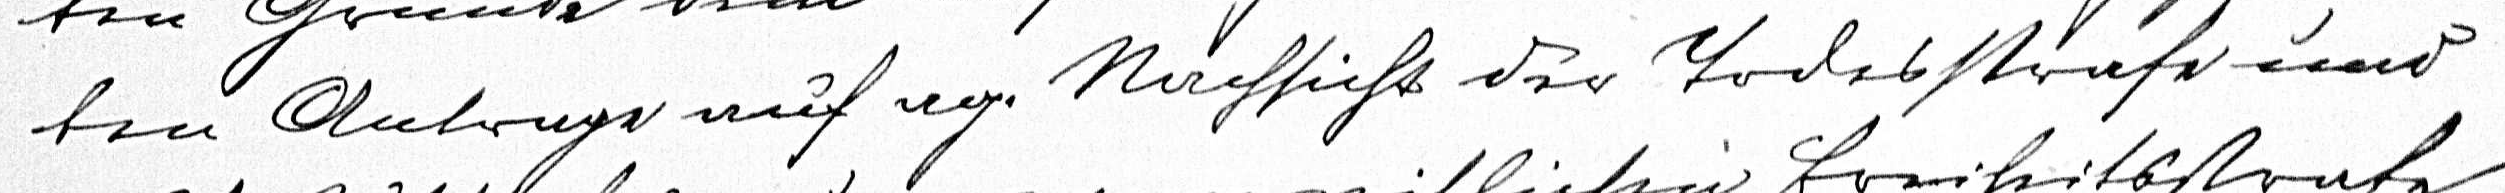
ten Antrage auf ag. Nachsicht der Todesstrafe und
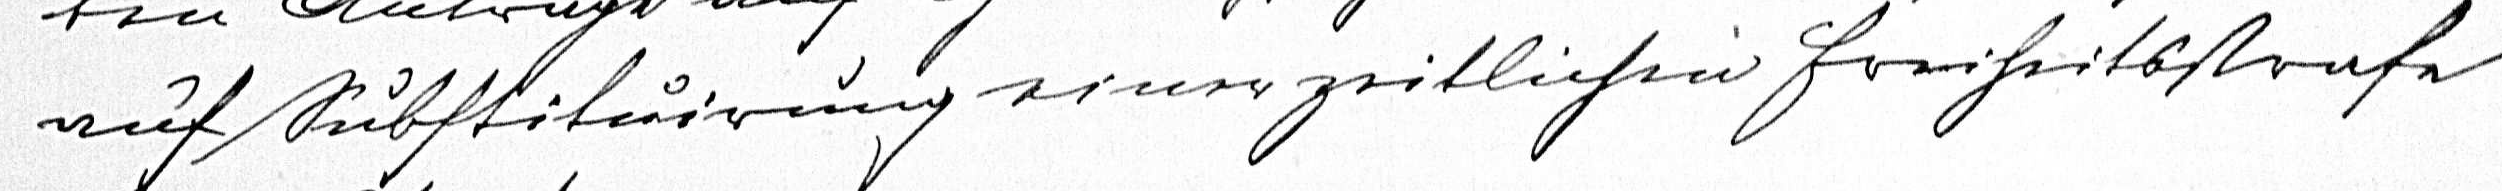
auf Substituirung einer zeitlichen Freiheitsstrafe
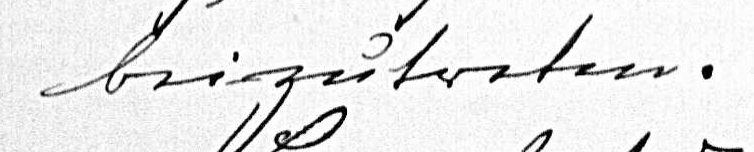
beizutreten.
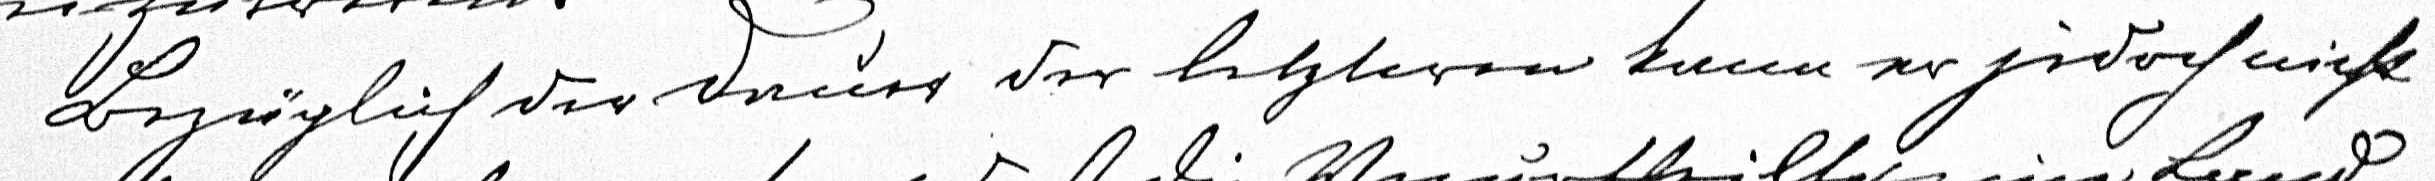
Bezüglich der Dauer der letzteren kann er jedoch nicht
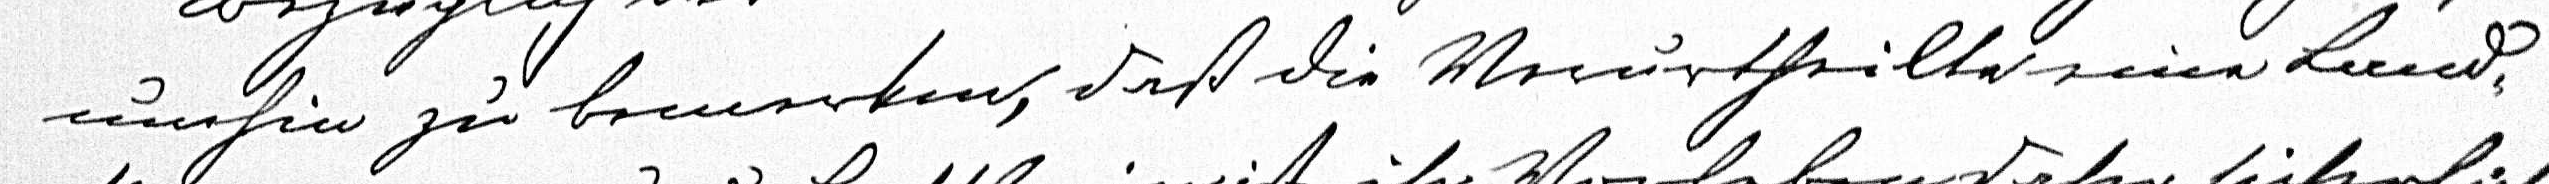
umhin zu bemerken, daß die Verurtheilte eine Land¬
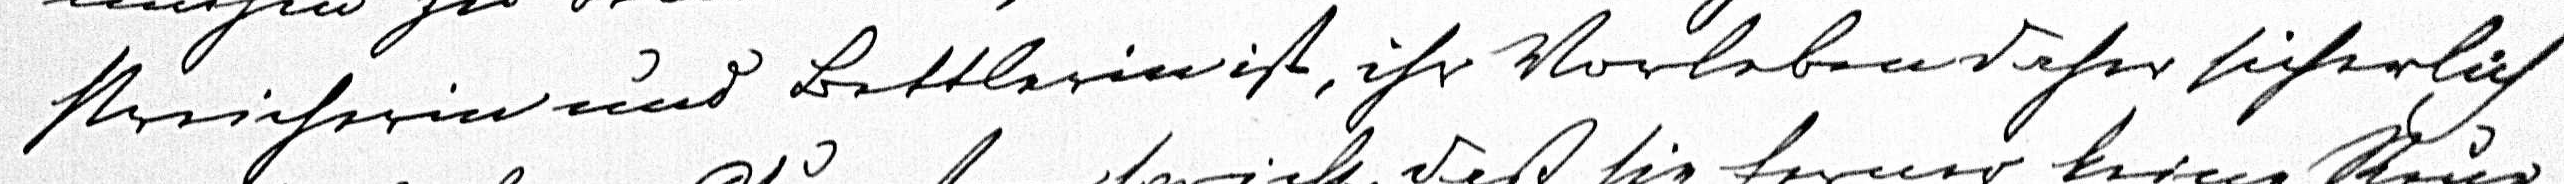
streicherin und Bettlerin ist, ihr Vorleben daher sicherlich
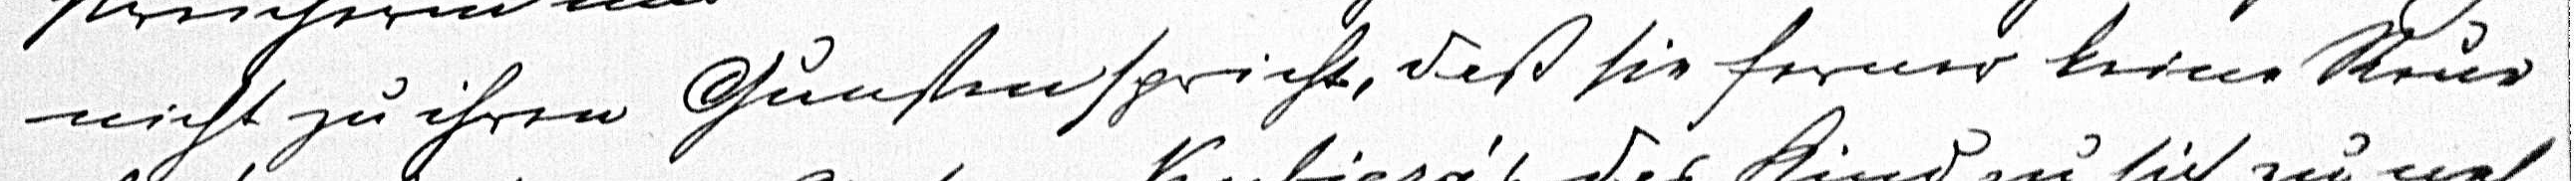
nicht zu ihren Gunsten spricht, das sie ferner keine Reue
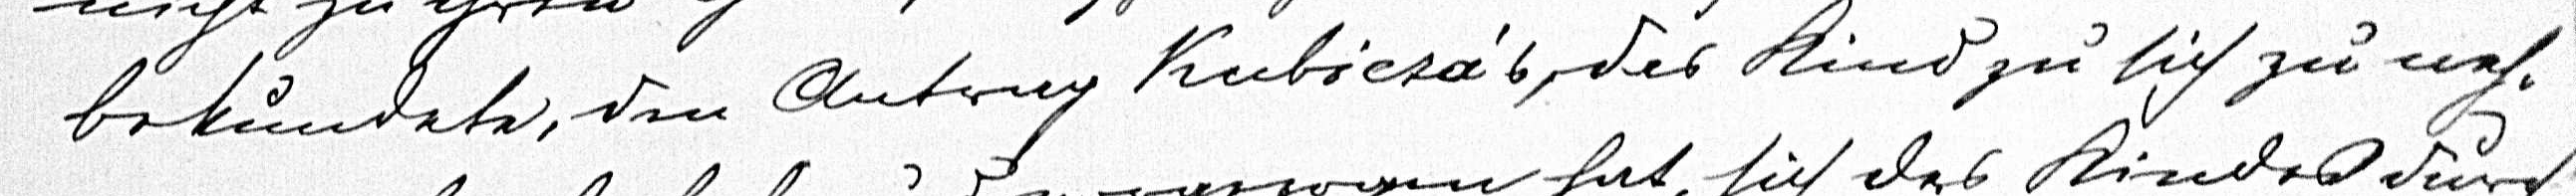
bekundete, den Antrag Kubicza’s, das Kind zu sich zu neh¬
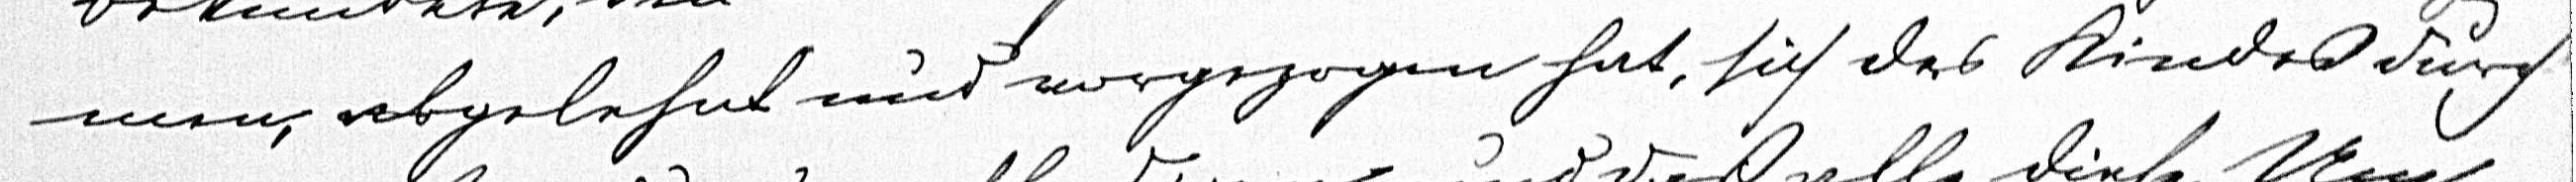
men, abgelehnt und vorgezogen hat, sich des Kindes durch
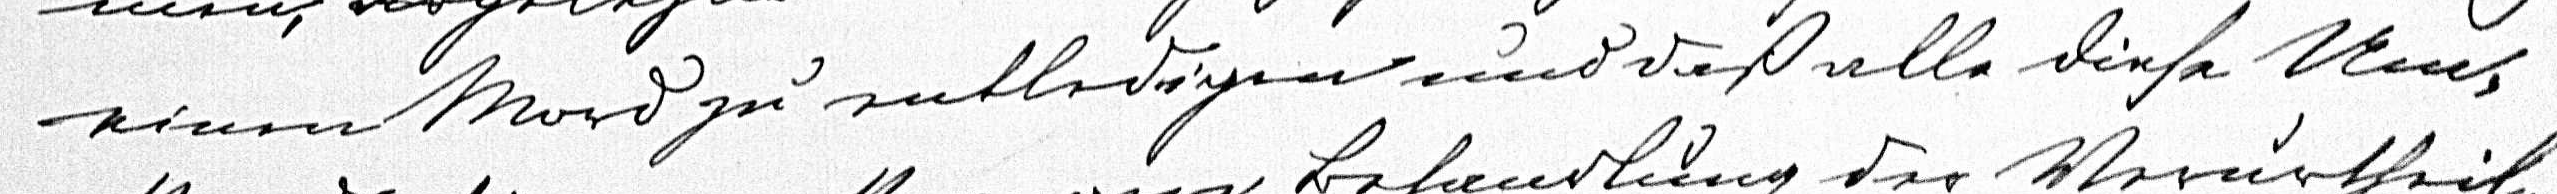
einen Mord zu entledigen und daß alle diese Um¬
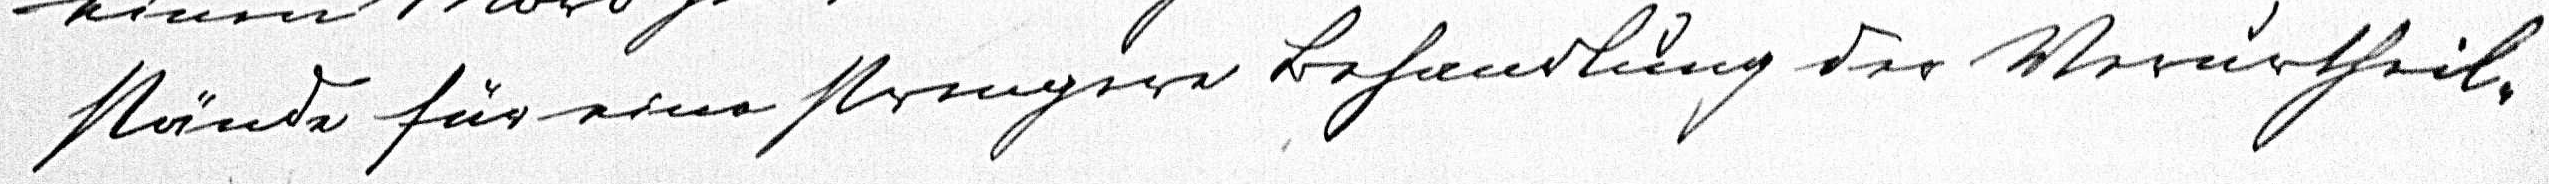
stände für eine strengere Behandlung der Verurtheil¬
